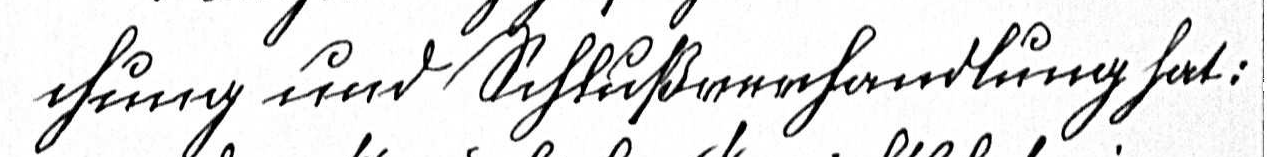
chung und Schlußverhandlung hat:
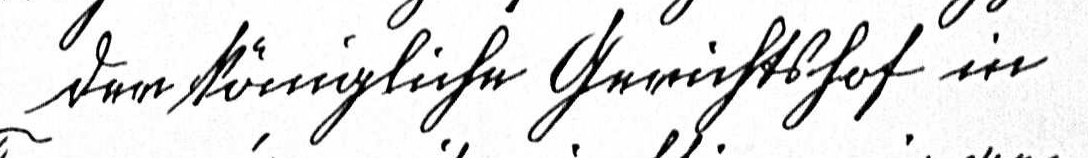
der königliche Gerichtshof in
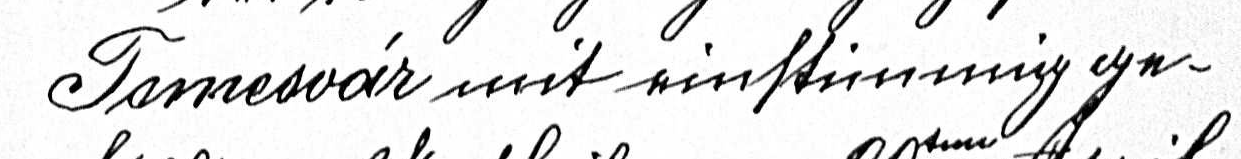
Temesvár mit einstimmig ge¬
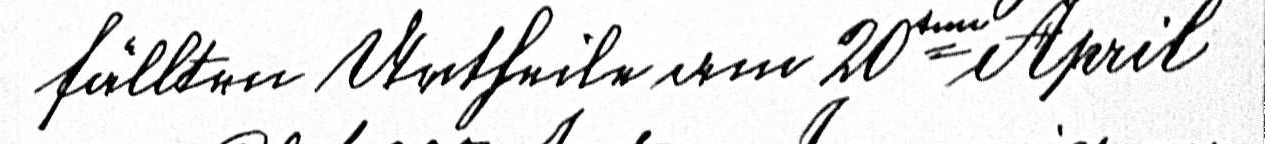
fällten Urtheile am 20ten April
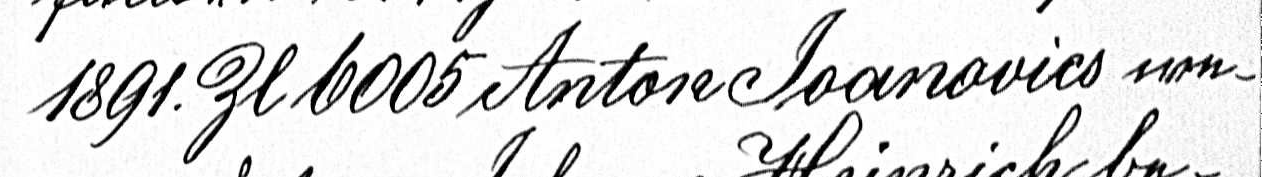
1891 Zl 6005 Anton Ioanovics we¬
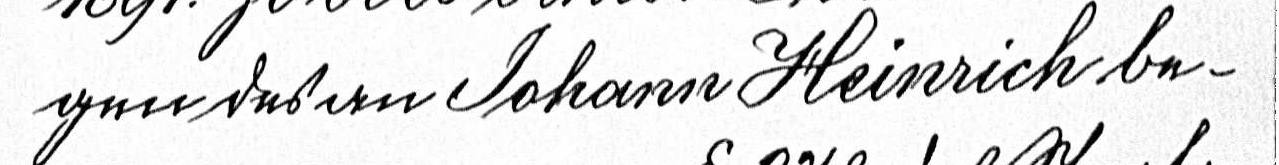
gen des an Johann Heinrich be¬
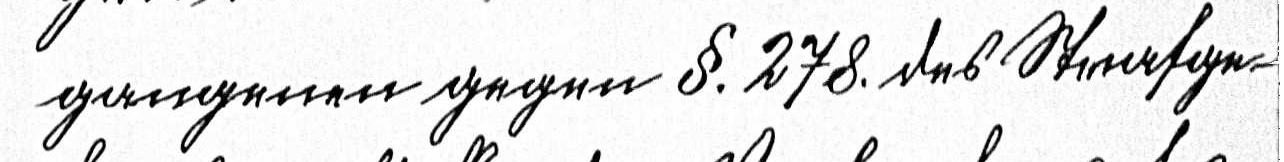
gangenen gegen §278 des Strafge¬
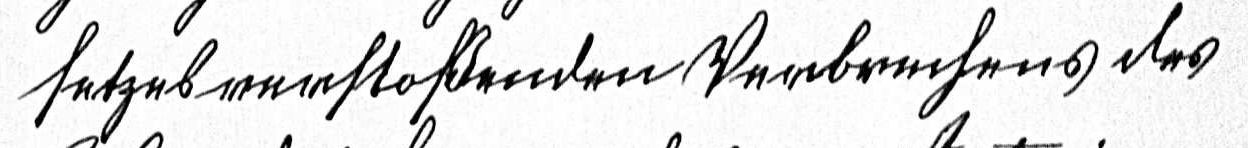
setzes verstoßenden Verbrechens des
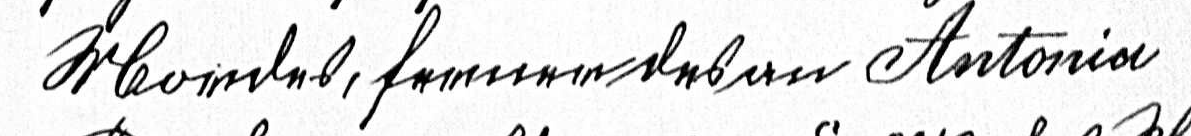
Mordes, ferner des an Antonia
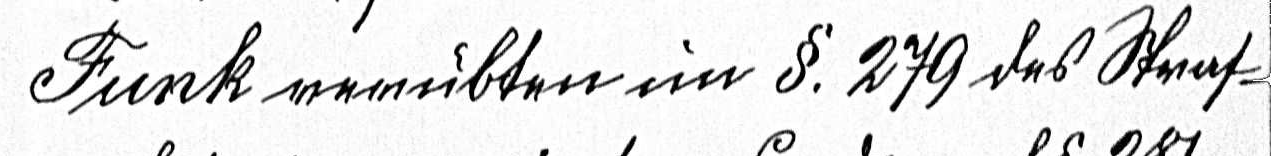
Funk verübten im §279 des Straf¬
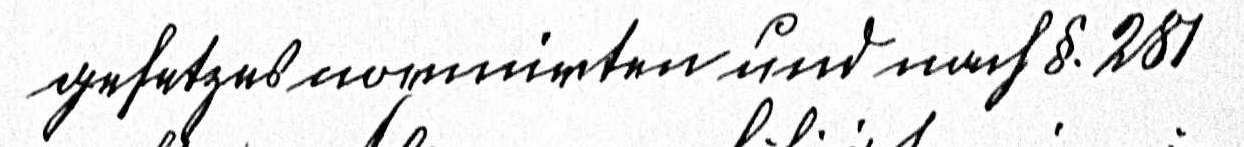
gesetzes normirten und nach §281
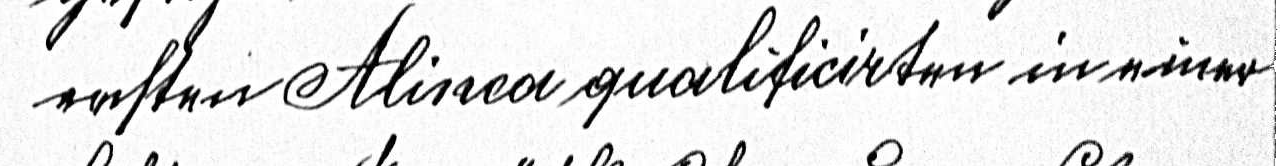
ersten Alinea qualificirten in einer
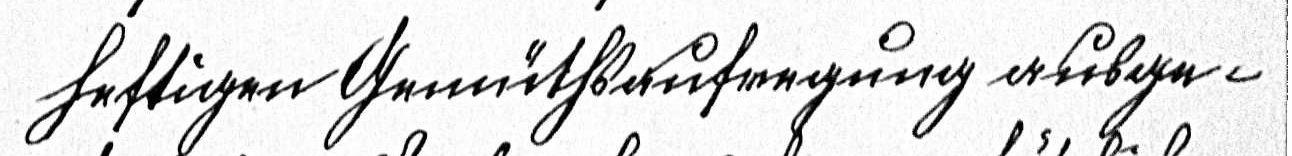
heftigen Gemüthsaufregung ausge¬
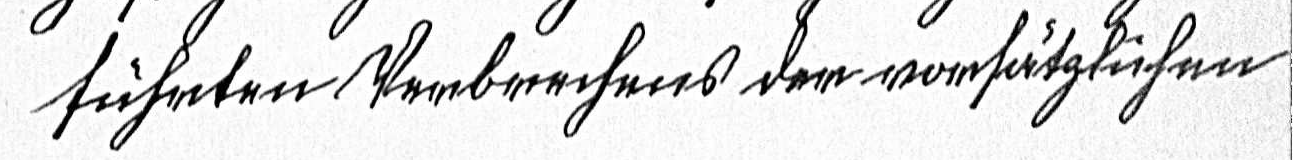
führten Verbrechens der vorsätzlichen
